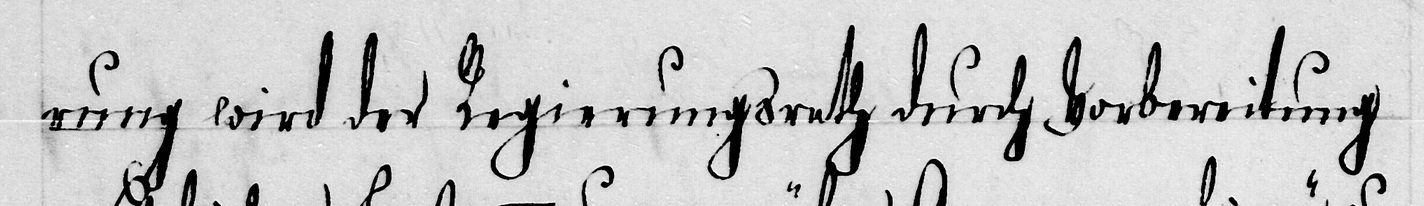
rung wird der Regierungsrath durch Vorbereitung
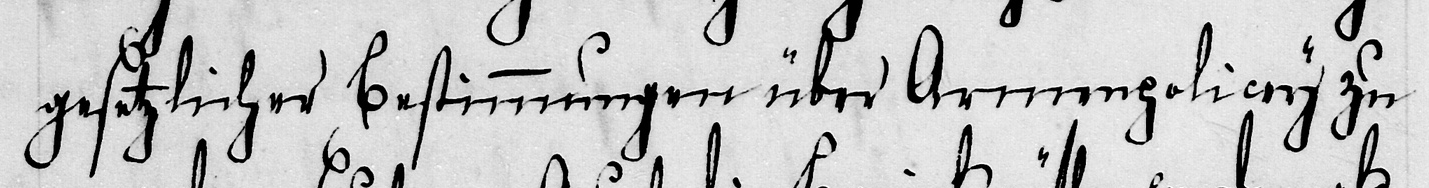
gesetzlicher Bestimmungen über Armenpolicey zu
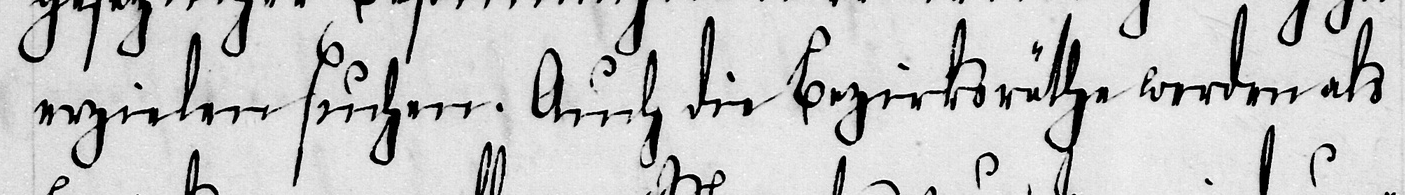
erzielen suchen. Auch die Bezirksräthe werden als
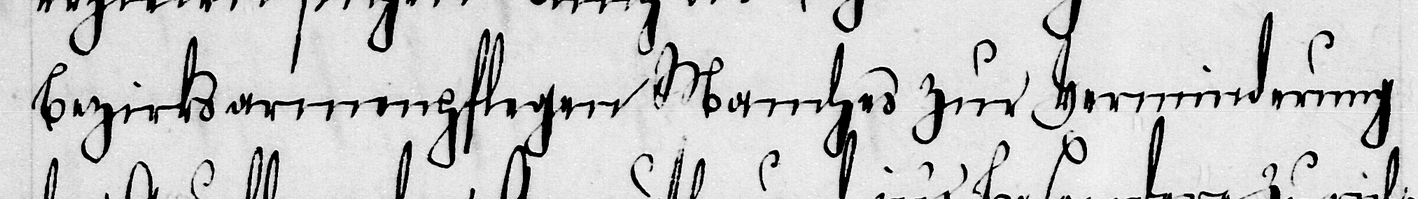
Bezirksarmenpflegen Manches zur Verminderung
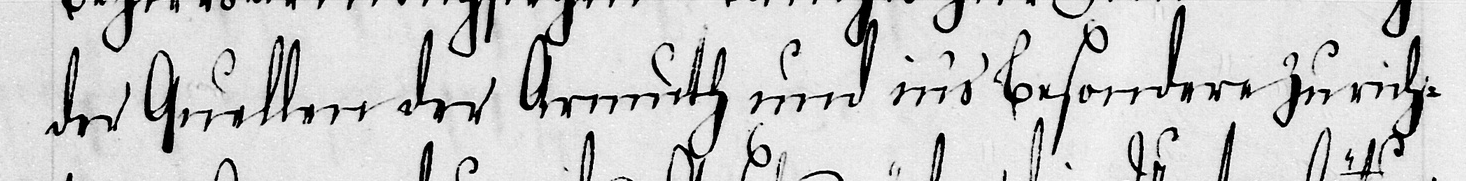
der Quellen der Armuth und in’s Besondere zu rich¬
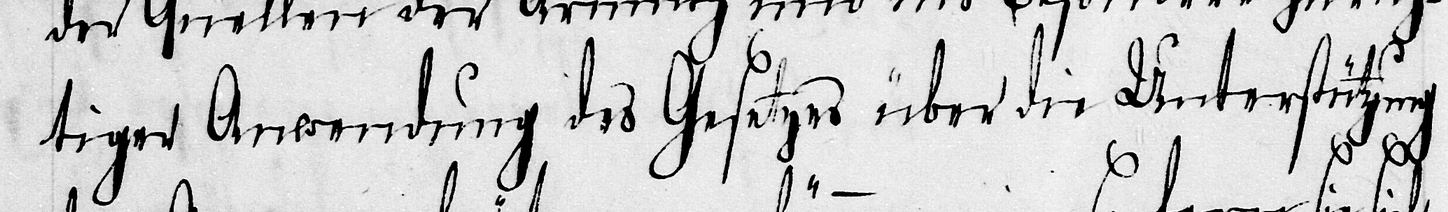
tiger Anwendung des Gesetzes über die Unterstützung
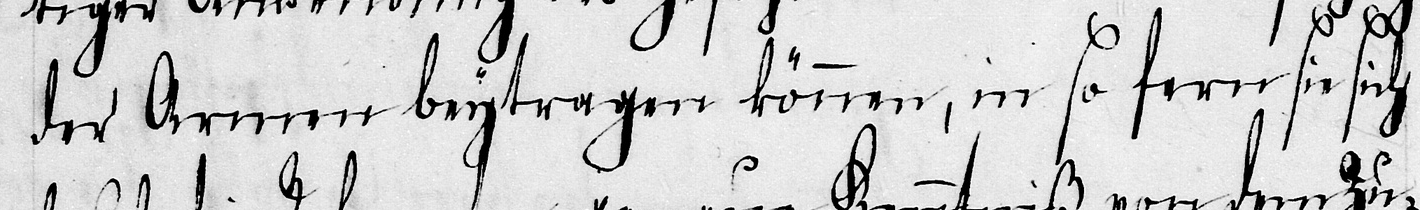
der Armen beytragen können, in so fern sie sich
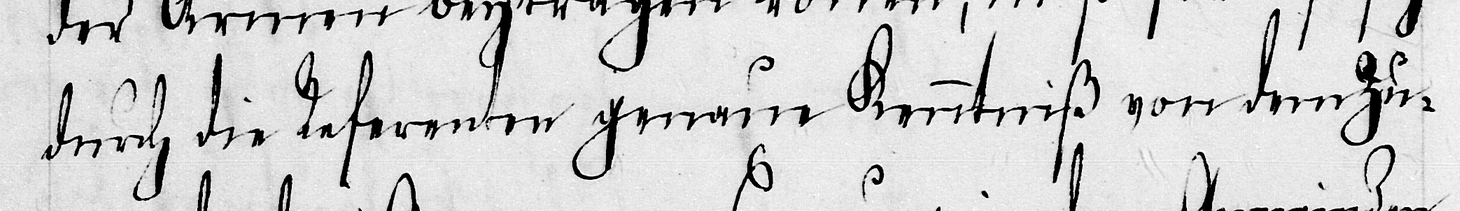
durch die Referenten genaue Kenntniß von dem Zu¬
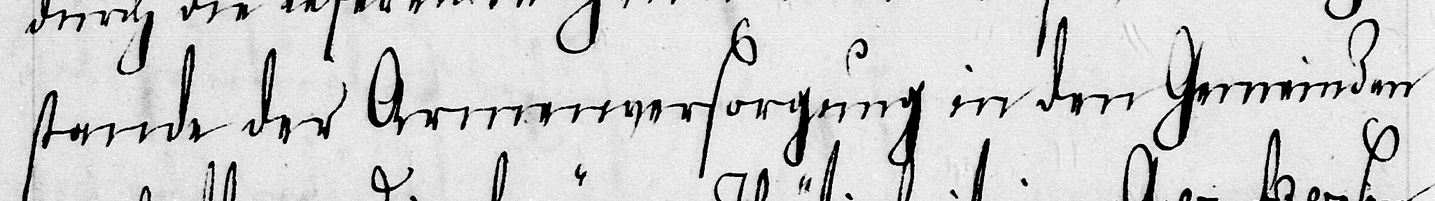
stande der Armenversorgung in den Gemeinden
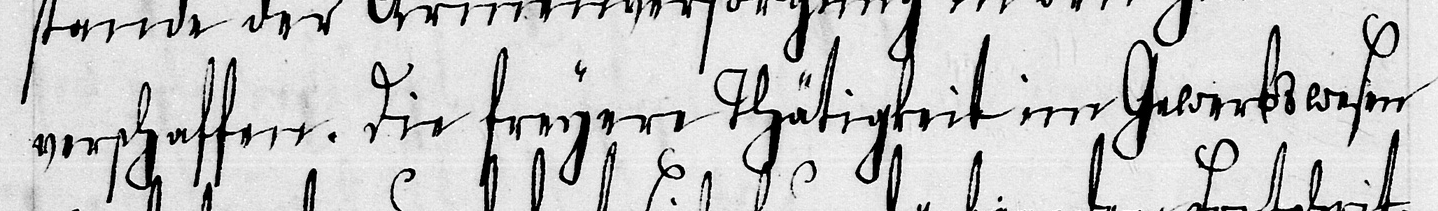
verschaffen. Die freyere Thätigkeit im Gewebswesen
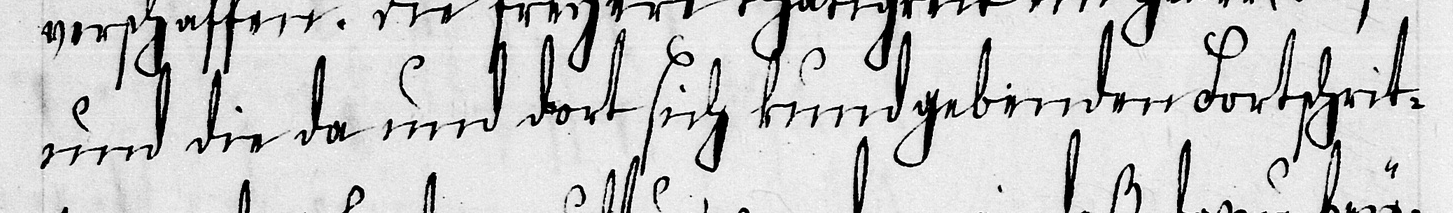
und die da und dort sich kundgebenden Fortschrit¬
